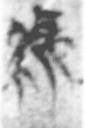綏
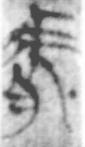○（虎）
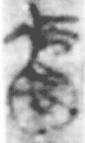○（韔）
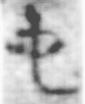屯
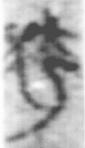狐
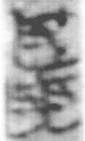聶（攝）
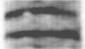二
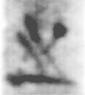之
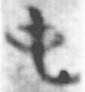屯
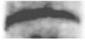一
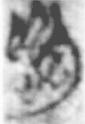○（絶）
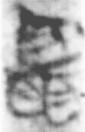聶（攝）
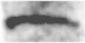一
